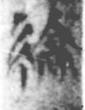縞
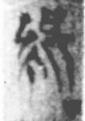綏
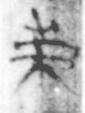朱
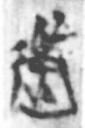○（衡）
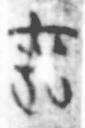戹（軛）
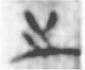之
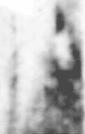○（組）
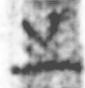之
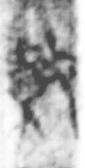○（綴）
